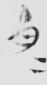月十
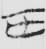甲
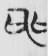申
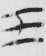王
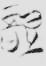○（屬）
